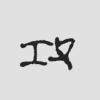攻
